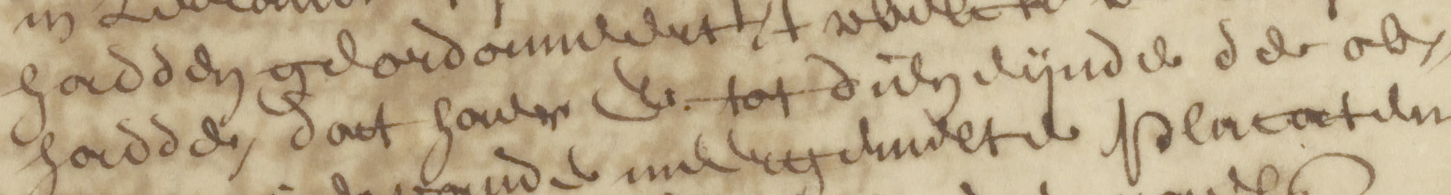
hadde, dat haer E. tot dien eijnde de ob„
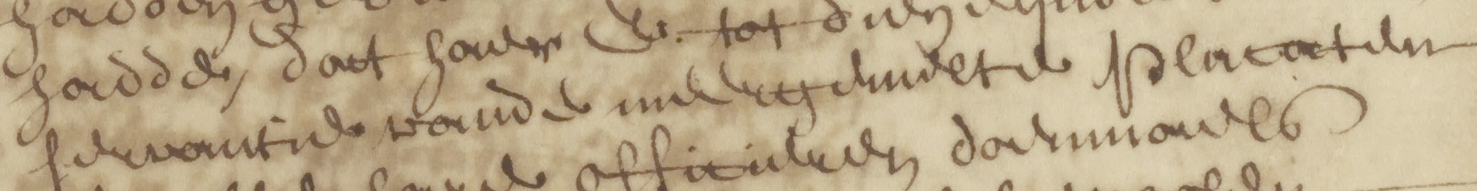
servantie vande meergemelte Placaten
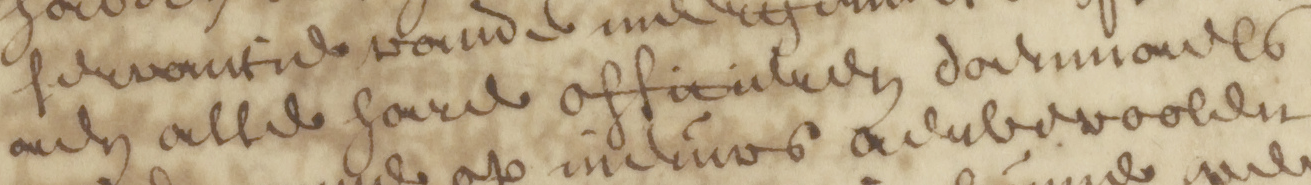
aen alle hare officieren doenmaels
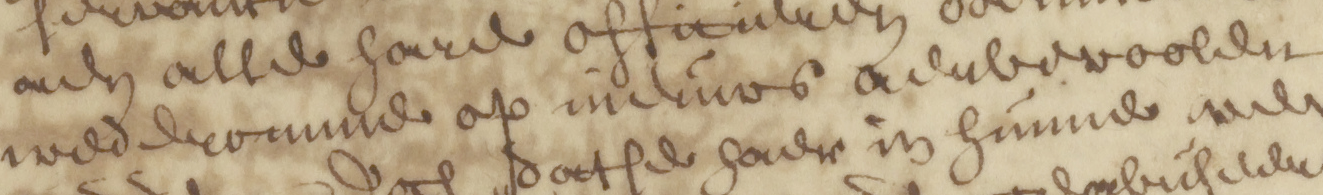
wederomme op nieuws aenbevoolen
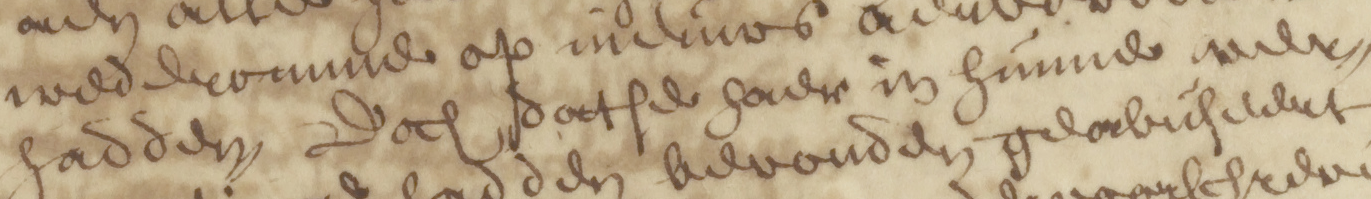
hadden, Doch datse haer in hunne ver„
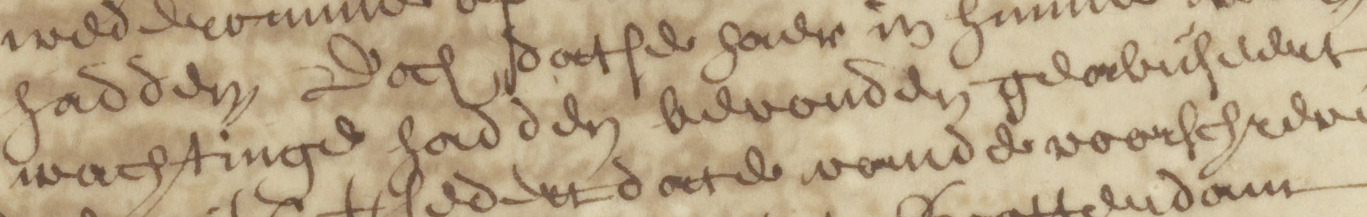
wachtinge hadden bevonden geabuseert,
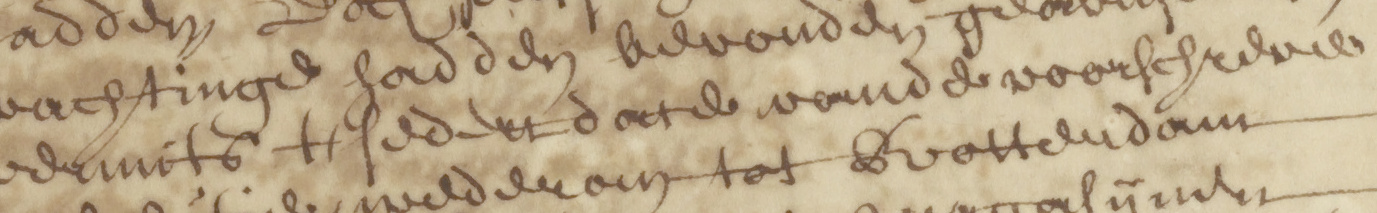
vermits, t‛sedert date vande voorschreve
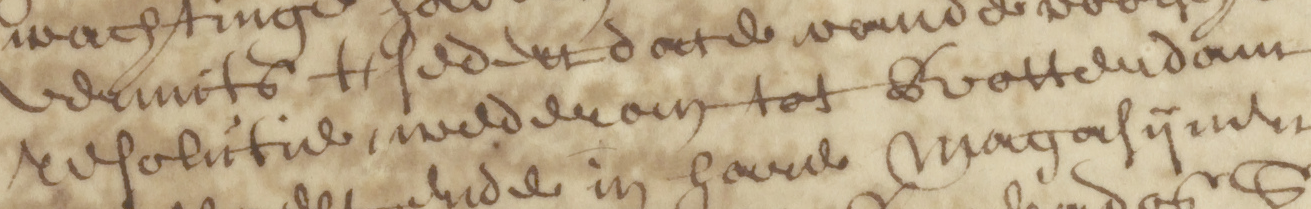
resolutie, wederom tot Rotterdam
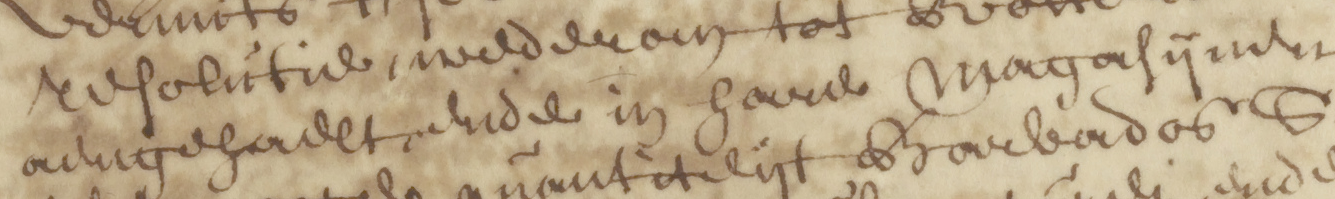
aengehaelt, ende in hare magasijnen
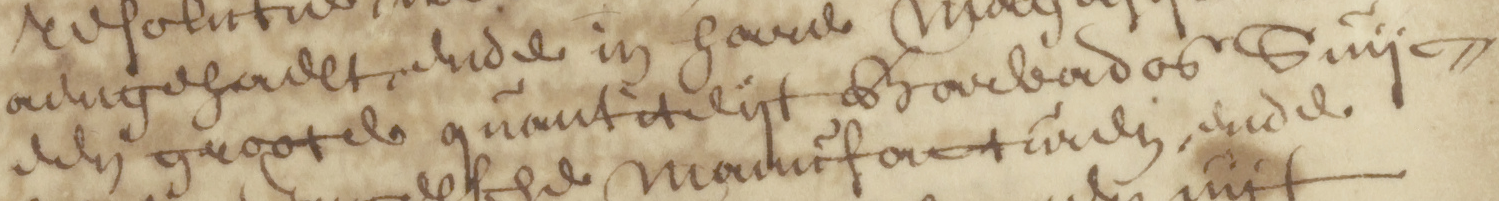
een groote quantiteijt Barbados Suijc„
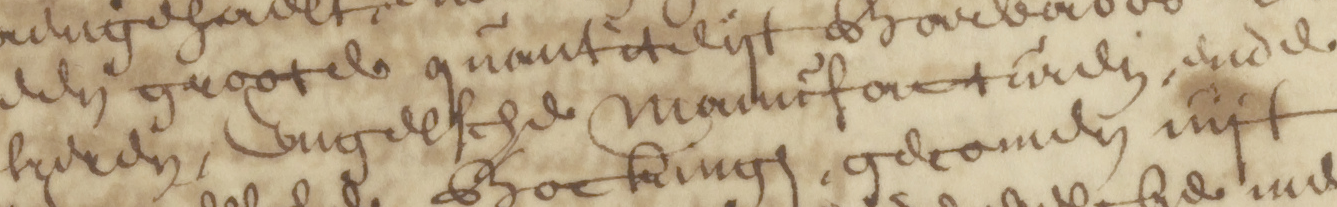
keren, Engelsche Manufacturen, ende
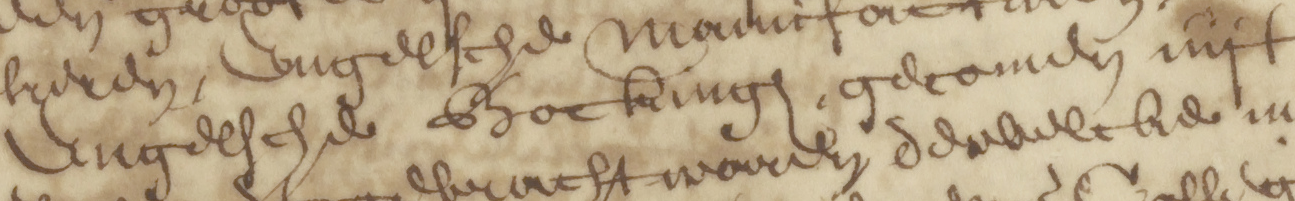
Engelsche Bockingh, gecomen uijt
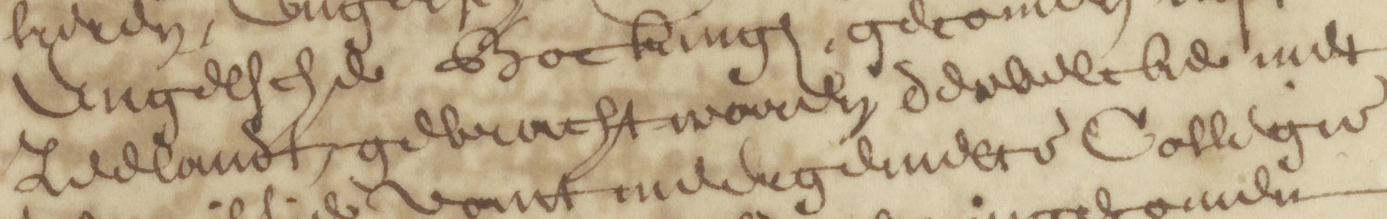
Zeelandt, gebracht waren, dewelcke met
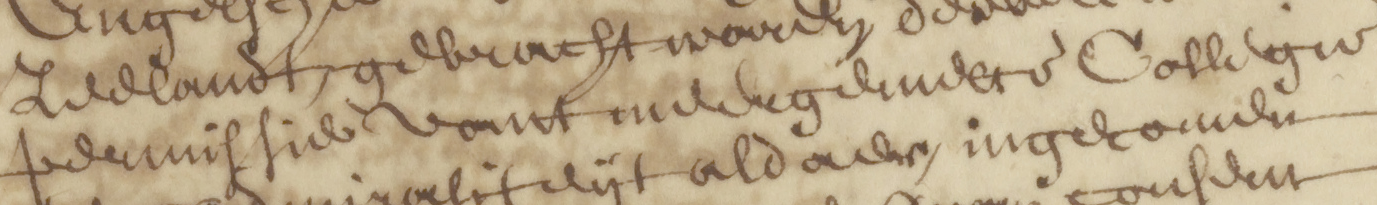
permissie vant meergemelte Collegie
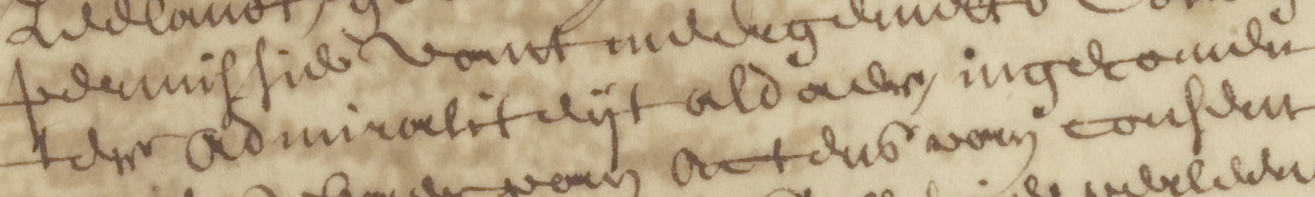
ter Admiraliteijt aldaer, ingecomen
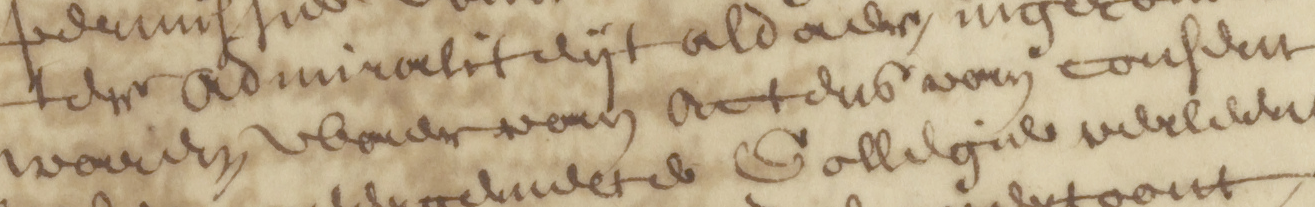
waren, waervan Actens van consent
